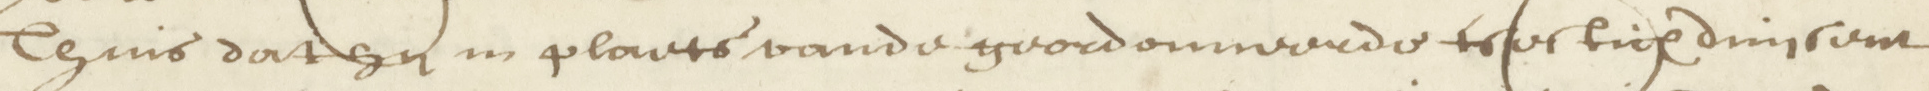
Thins dat hy in plaets vande geordonneerde tsestich duysent
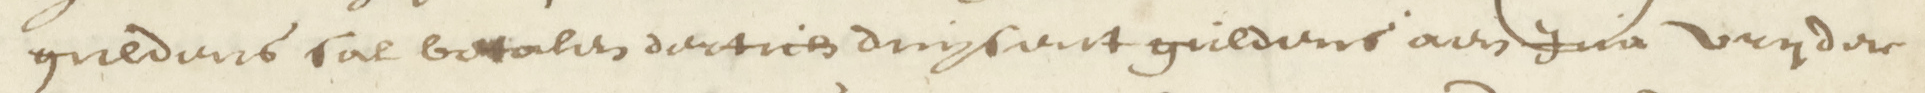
guldens sal betalen dertich duysent guldens aen Ina vryder
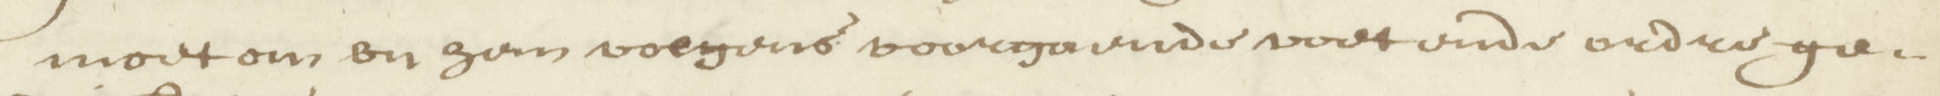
moet om by hem volgens voorgaende voet ende ordre ge„
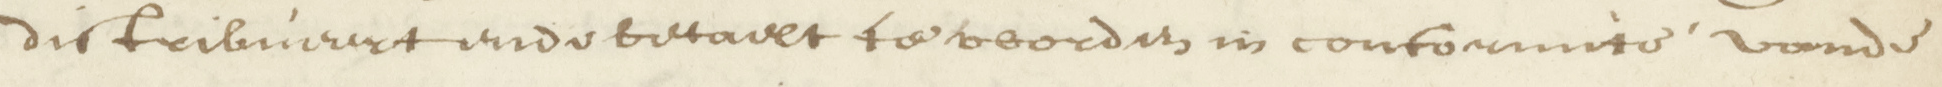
distribueert ende betaelt te worden in conformité vande
